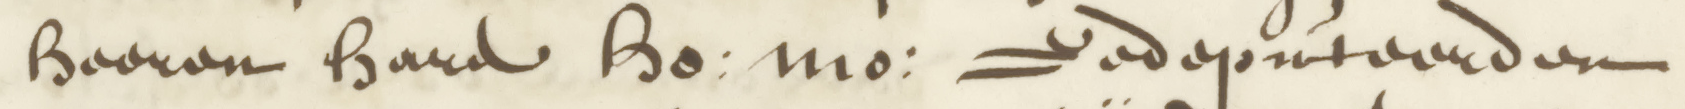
heeren hare Ho:Mo: Gedeputeerden
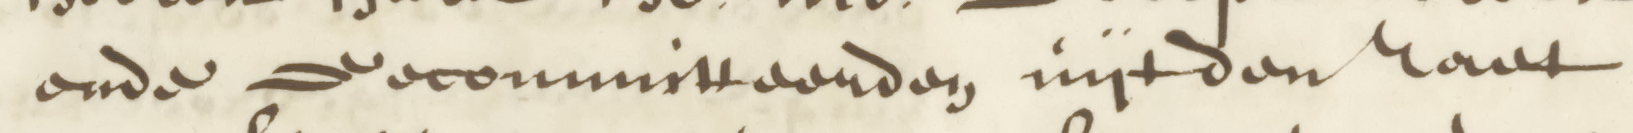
ende Gecommitteerden uijt den raet
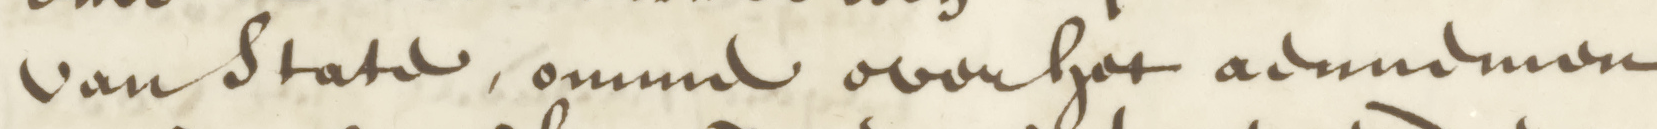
van State, omme over het aennemen
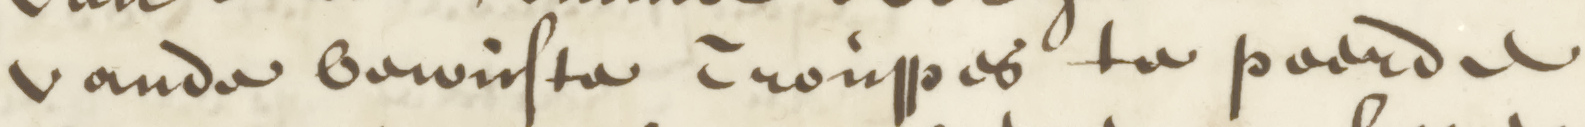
vande bewuste Trouppes te peerde
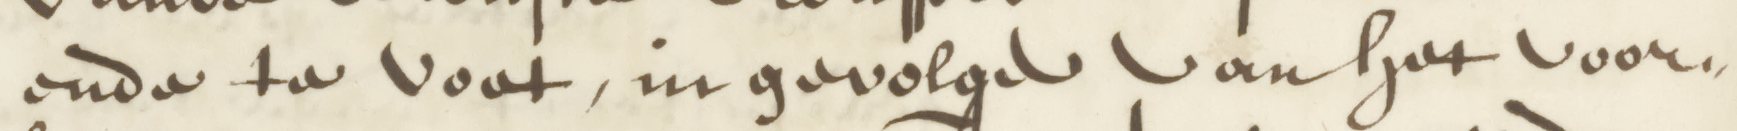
ende te voet, in gevolge van het voor„
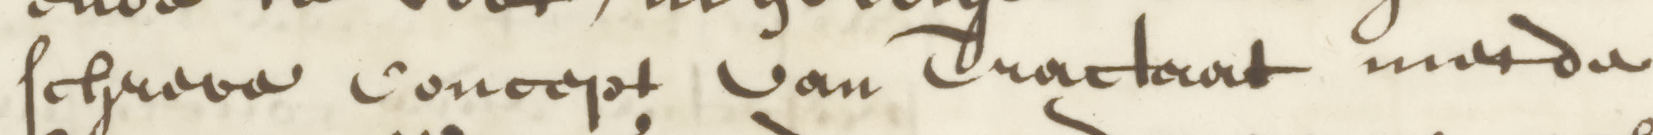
,,schreve Concept van Tractaat met de
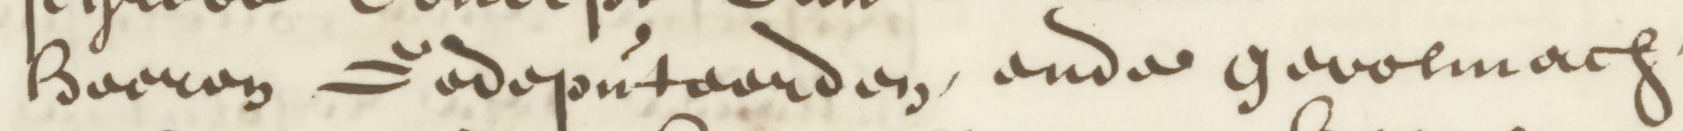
heeren Gedeputeerden, ende gevolmach,,
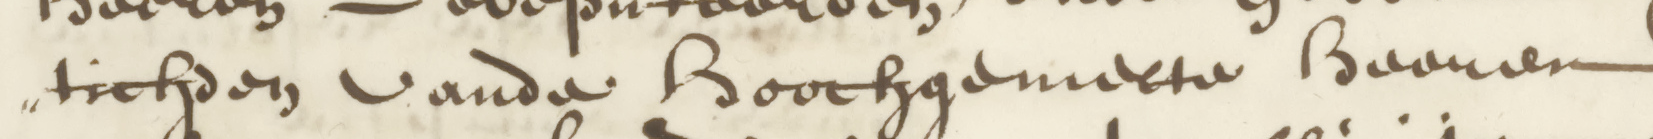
„tichden vande Hoochgemelte Heeren
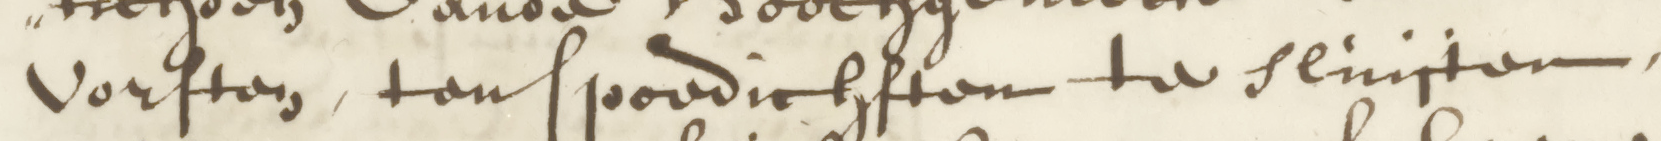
vorsten, ten spoedichsten te sluijten,
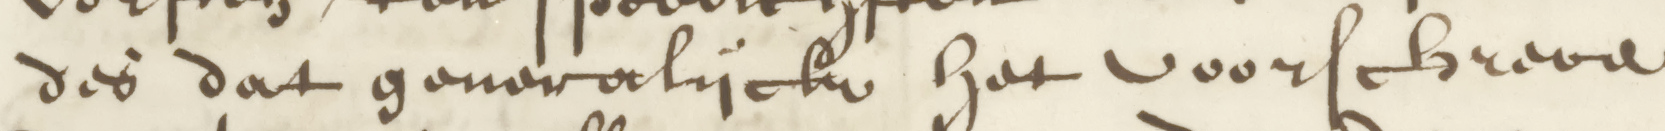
des dat generalijck het voorschreve
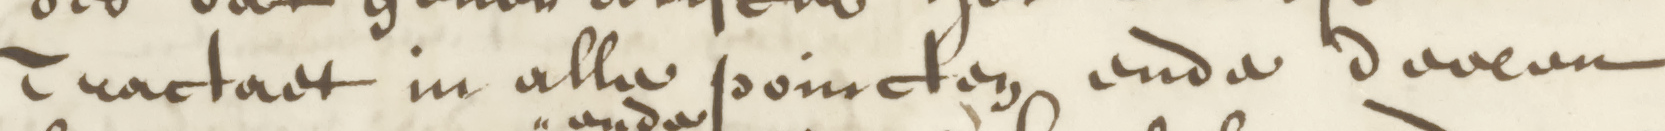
Tractaet in alle poincten ende deelen
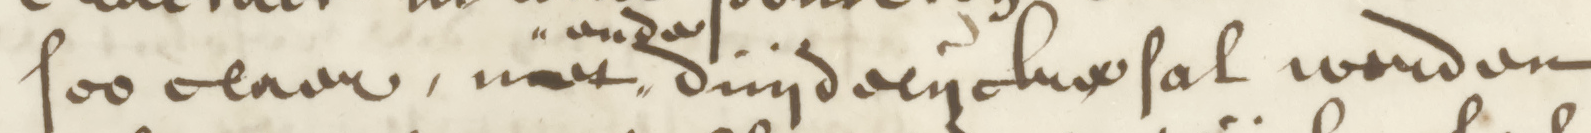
soo claer, net,, ''ende duijdelijcke sal worden
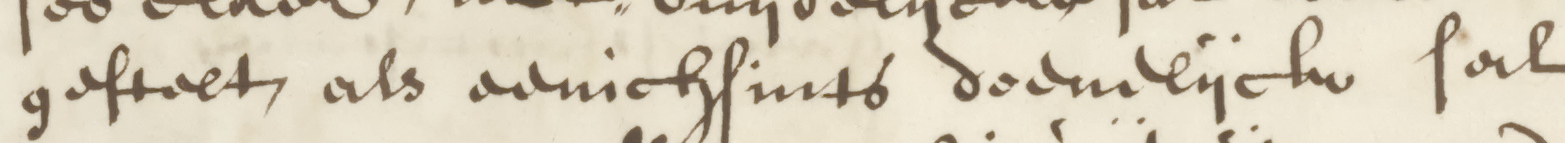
gestelt, als eenichsints doenelijck sal
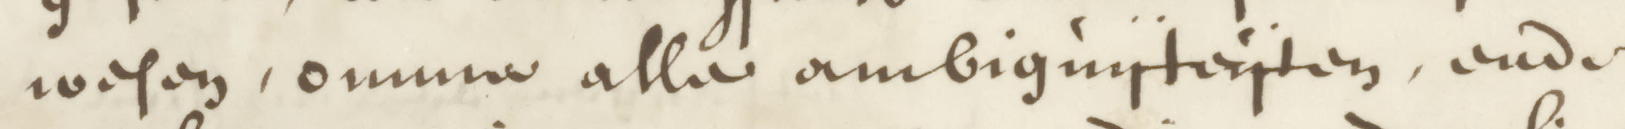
wesen, omme alle ambiguijteijten, ende
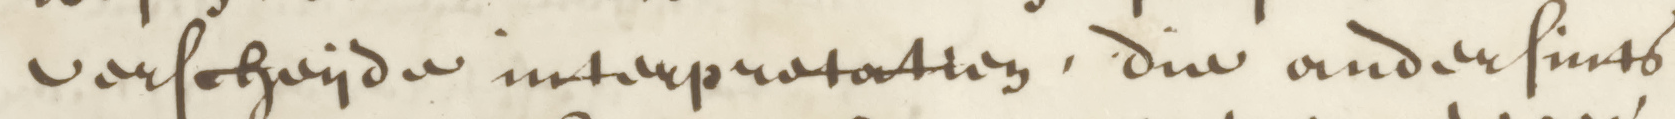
verscheijde interpretatien, die andersints
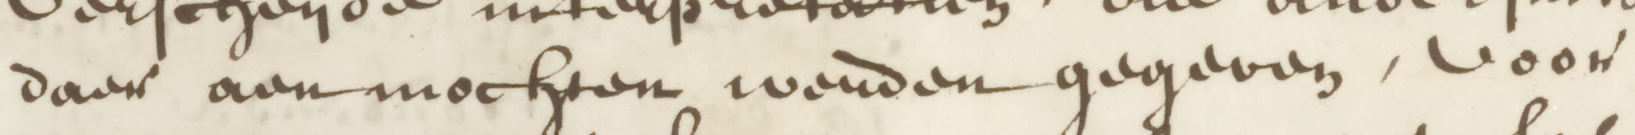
daer aen mochten werden gegeven, voor
